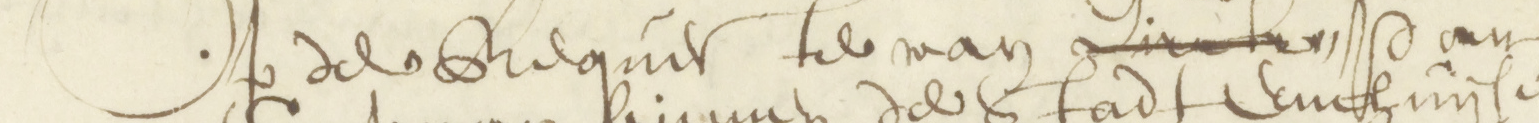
Op de requeste van Dirck,, Pan
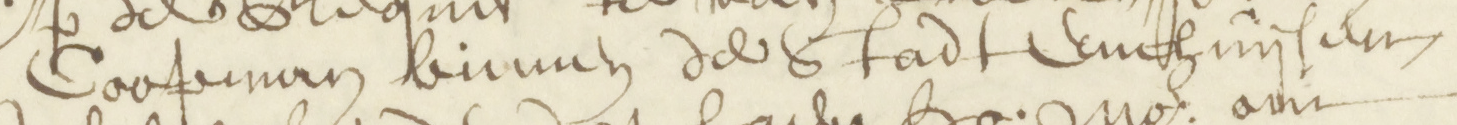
Coopman binnen de Stadt Enchuijsen,
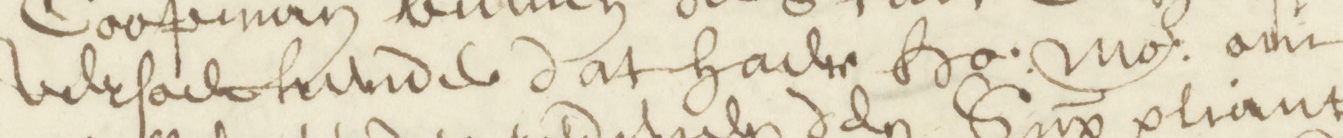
versoeckende dat haer Ho:Mo: om
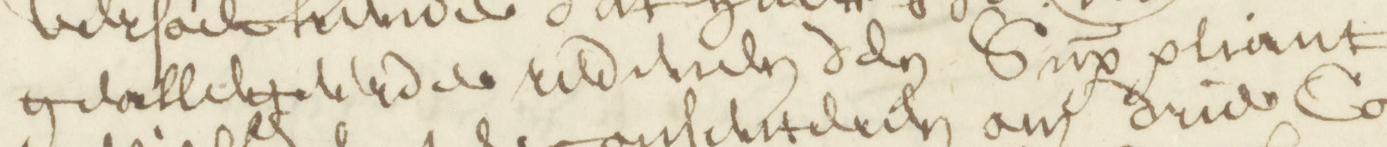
geallegeerde redenen den Suppliant
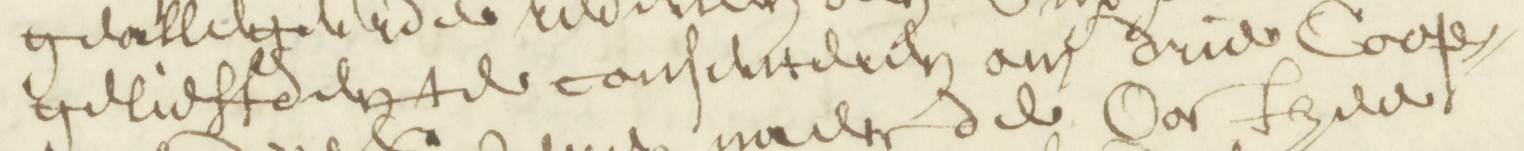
gelieffden te consenteren om drie Coop„
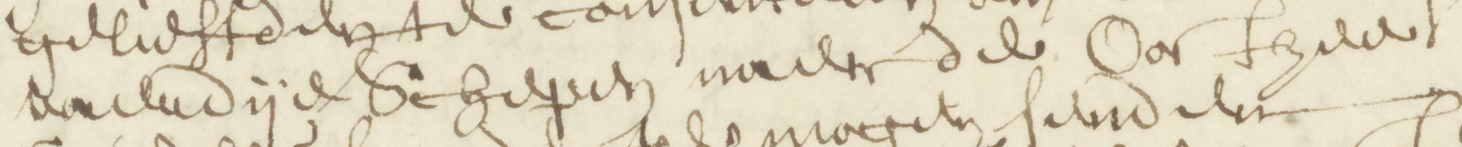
vaerdije Schepen naer de Oostzee
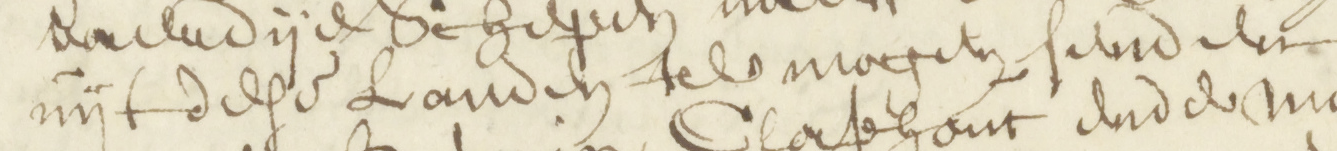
uijt dese Landen te mogen senden„
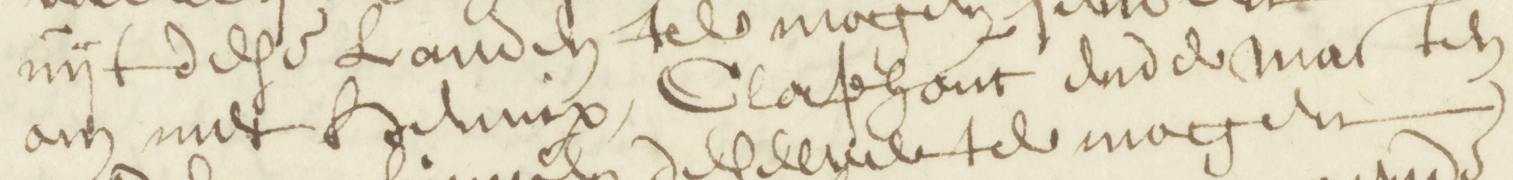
om met Hennip, Claphout ende masten
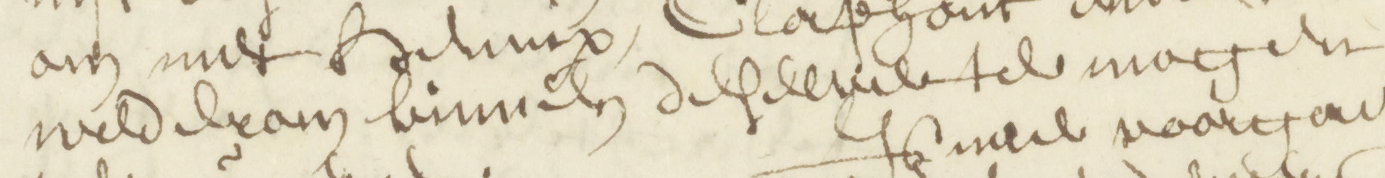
wederom binnen deselve te mogen
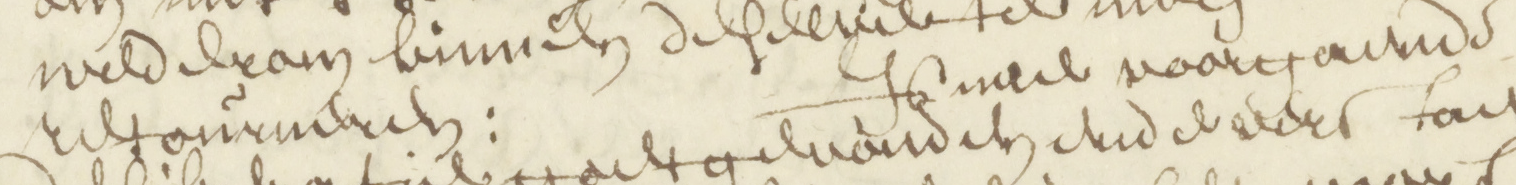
retourneren: Is nae voorgaende
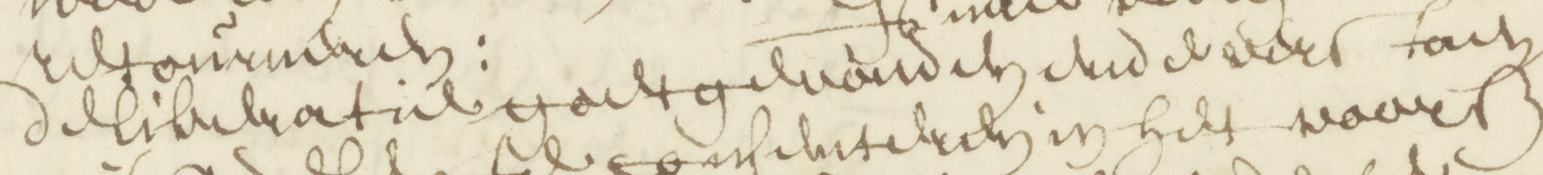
deliberatie goetgevonden ende verstaen
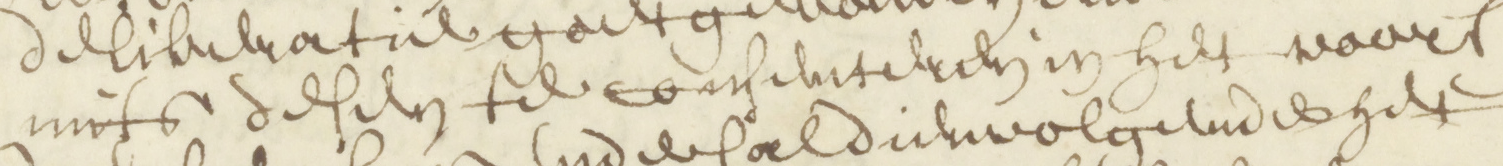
mits desen te consenteren in het voors
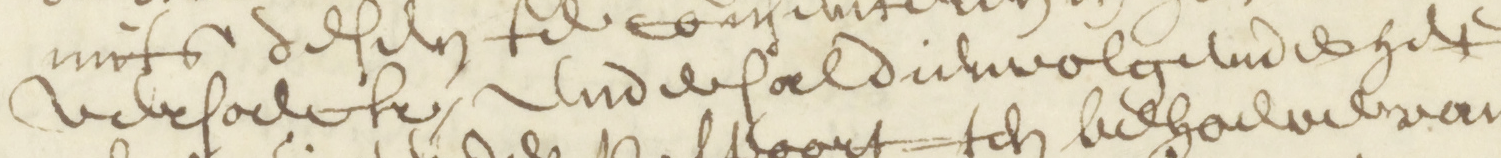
versoeck, ende sal dienvolgende het
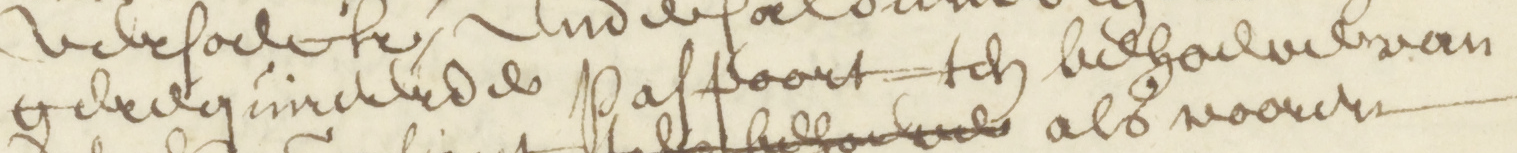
gerequireerde paspoort ten behoeve van
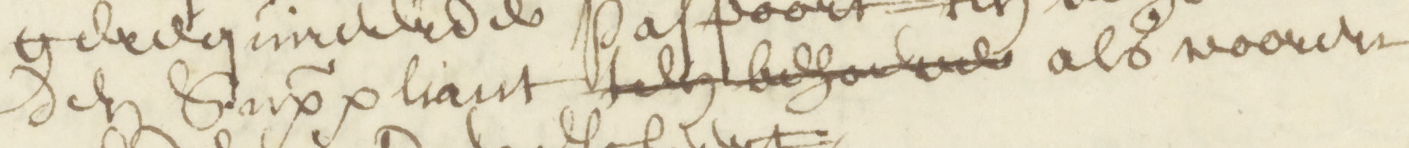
den suppliant ten behoeve als vooren
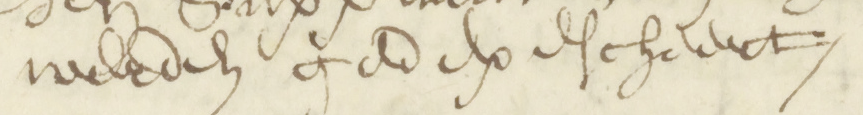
werden gedepescheert.
